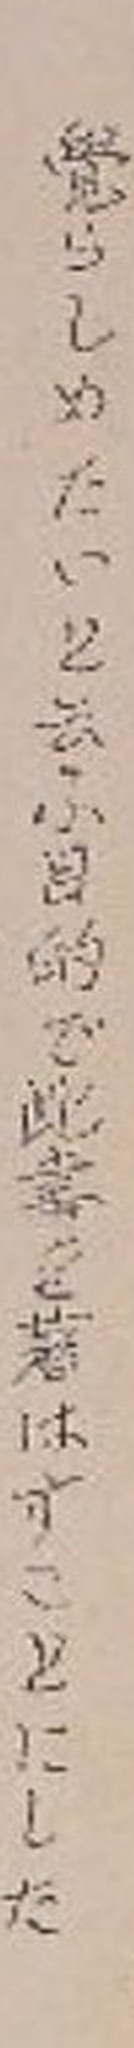覚らしめたいと云ふ目的で此書を著はすことにした
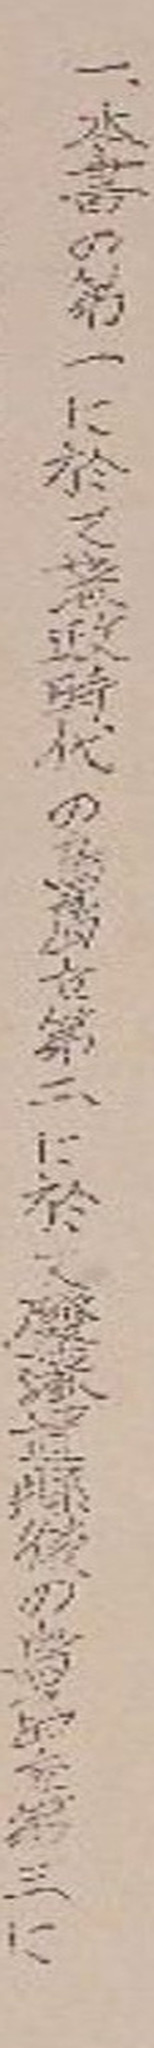一．本書の第一に於て藩政時代の鳥島を第二に於て廃藩置県後の鳥島を第三に
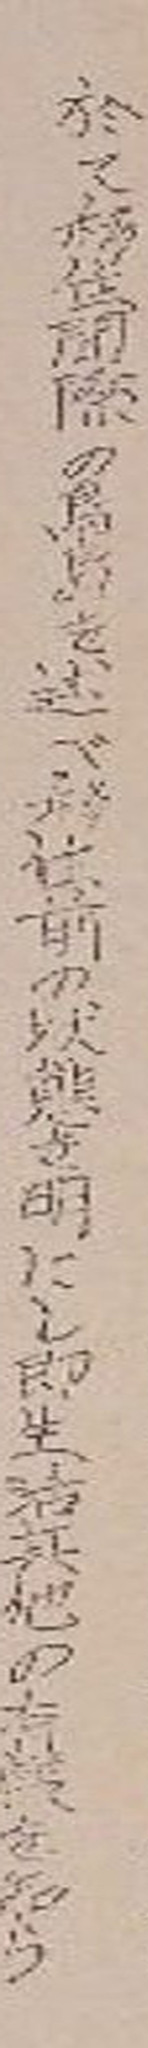於て移住間際の鳥島を述べ移住前の状態を明にし即生活其他の有様を知ら
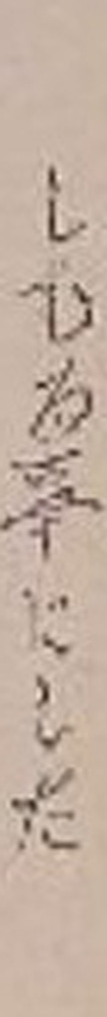しむる事にした
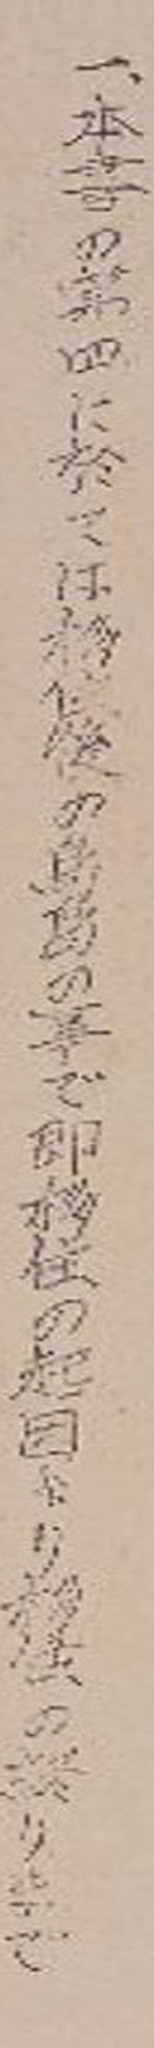一．本書の第四に於ては移住後の鳥島の事で即移住の起因より移住の終りまで
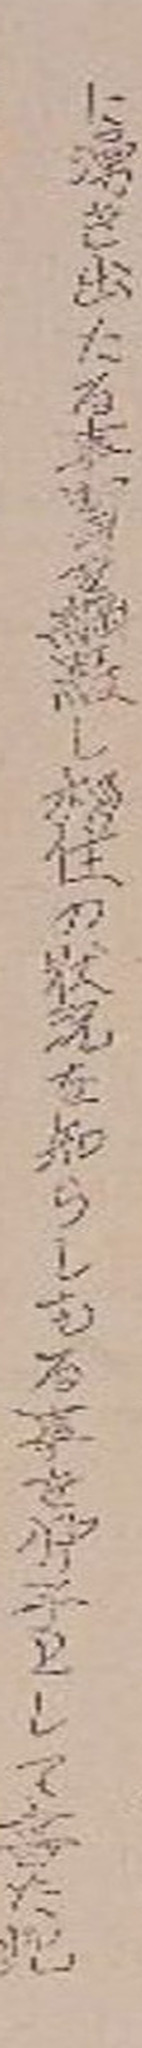に湧き出たる事項を網羅し移住の状況を知らしむる事を骨子として書た此
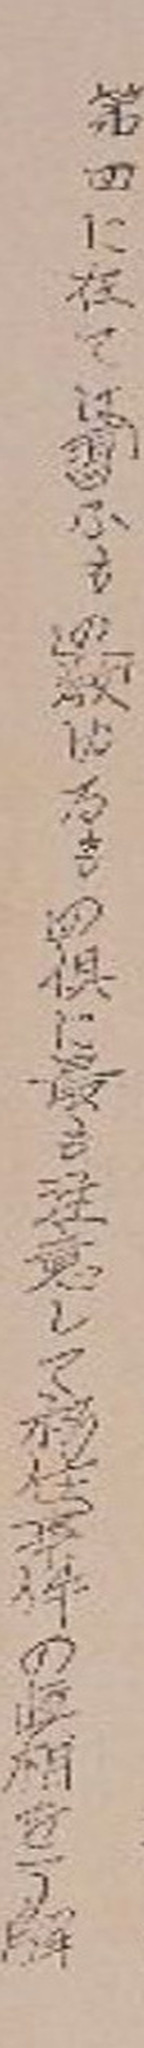第四に在ては「習ふもの」「教ゆるもの」倶に最も注意して移住事件の真相を了解

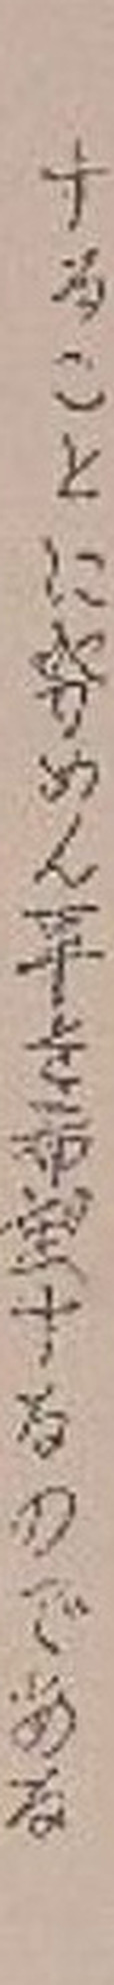することに努めん事を希望するのである
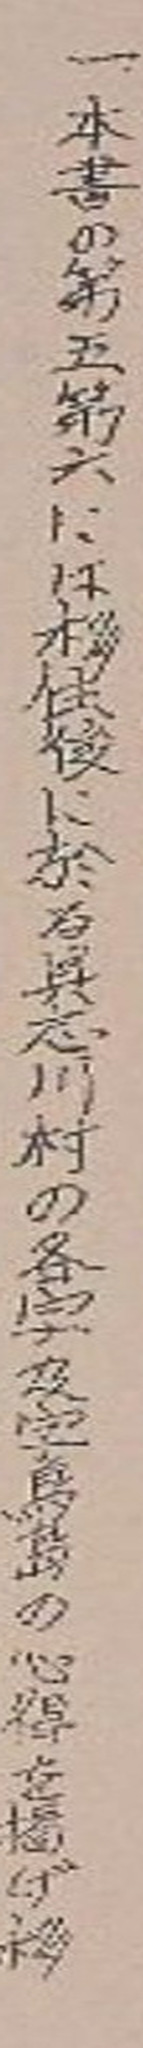一．本書の第五第六には移住後に於る具志川村の各字及び字鳥島の心得を掲げ移
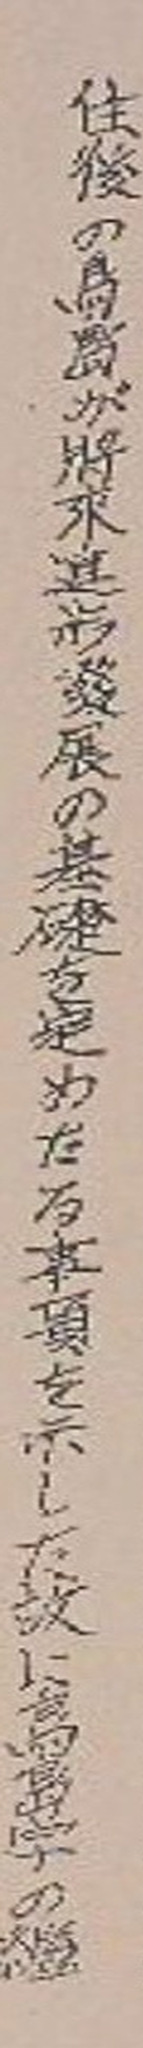住後の鳥島が将来進歩発展の基礎を定めたる事項を示した故に鳥島字の継
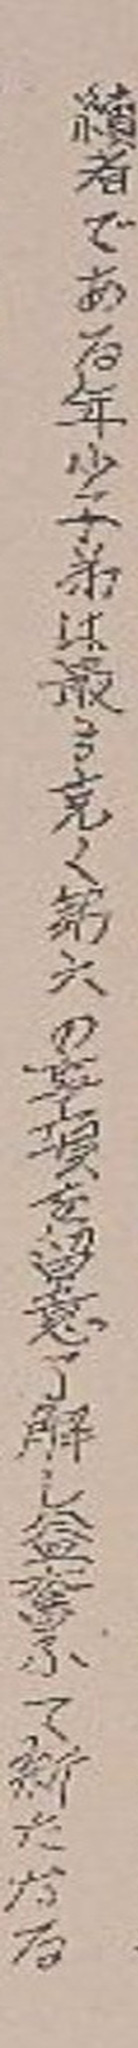続者である年少子弟は最も克く第六の事項を留意了解し益奮ふて新たなる
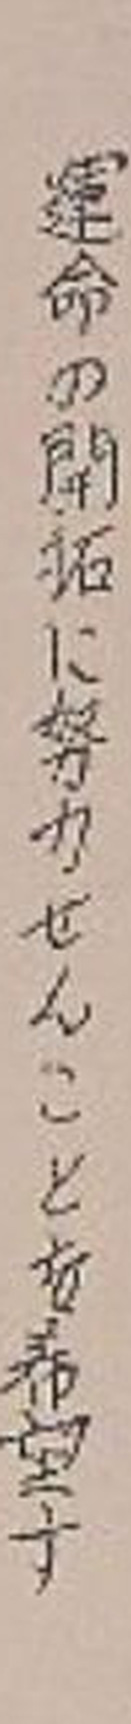運命の開拓に努力せんことを希望す
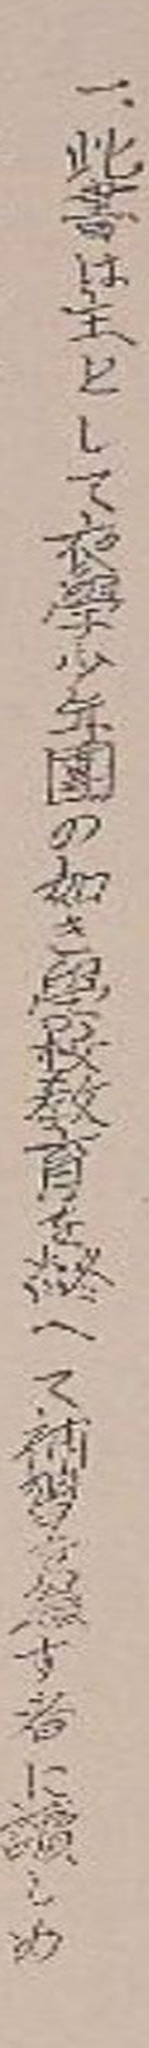一．此書は主として夜学少年団の如き学校教育を終へて補習を為す者に読しめ
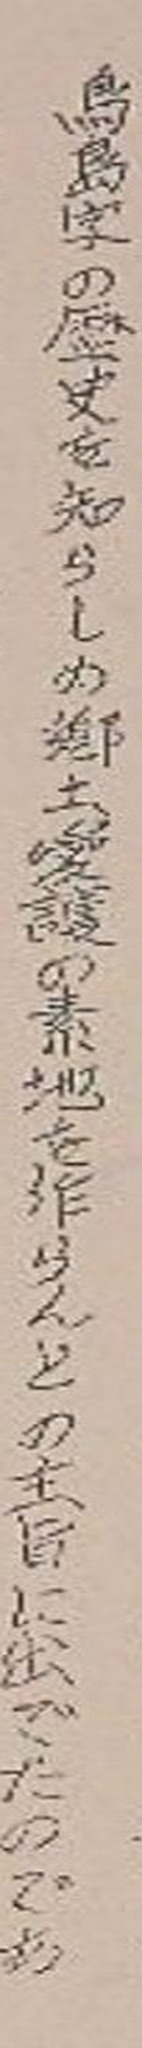鳥島字の歴史を知らしめ郷土愛護の素地を作らんとの主旨に出でたのであ
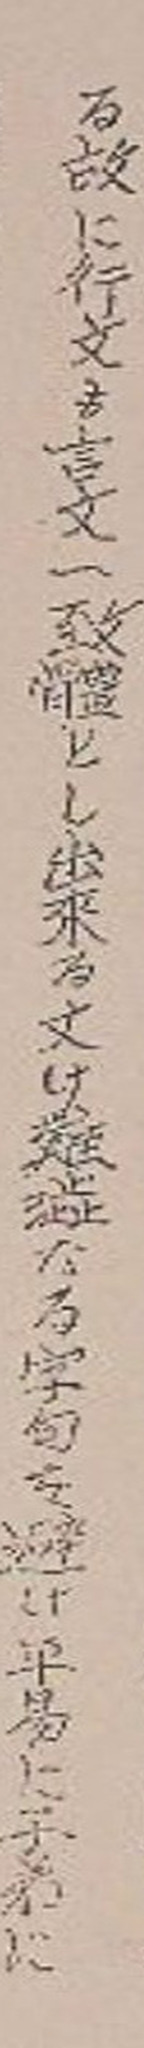る故に行文も言文一致体とし出来る丈け難渋なる字句を避け平易に子弟に
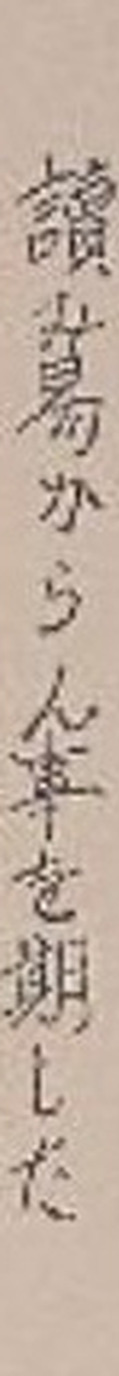読み易からん事を期した
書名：鳥島移住始末
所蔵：University of the Ryukyus Library
